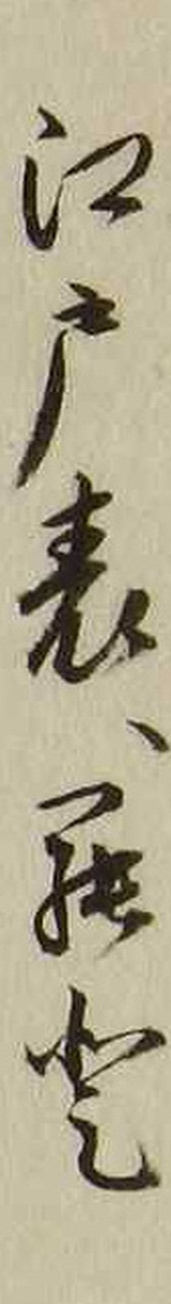江戸表へ罷登
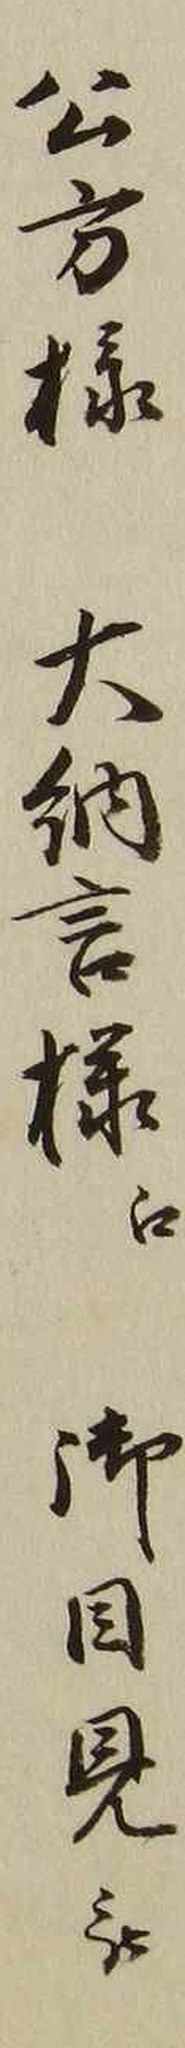公方様大納言様江御目見被
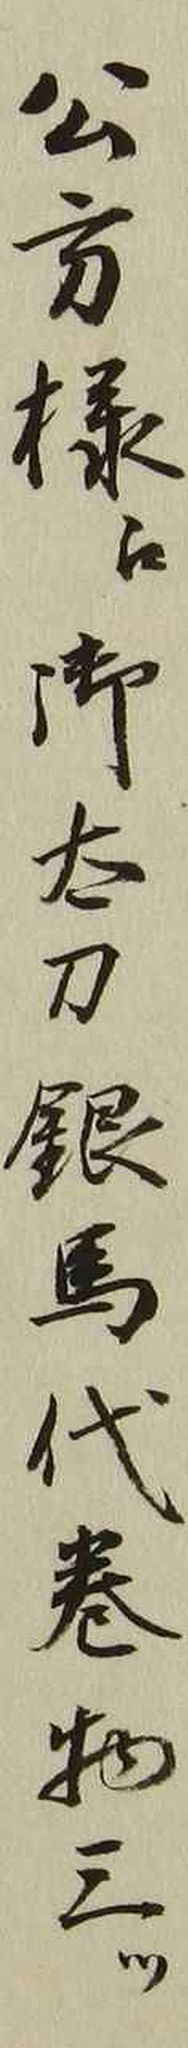公方様江御太刀銀馬代巻物三つ
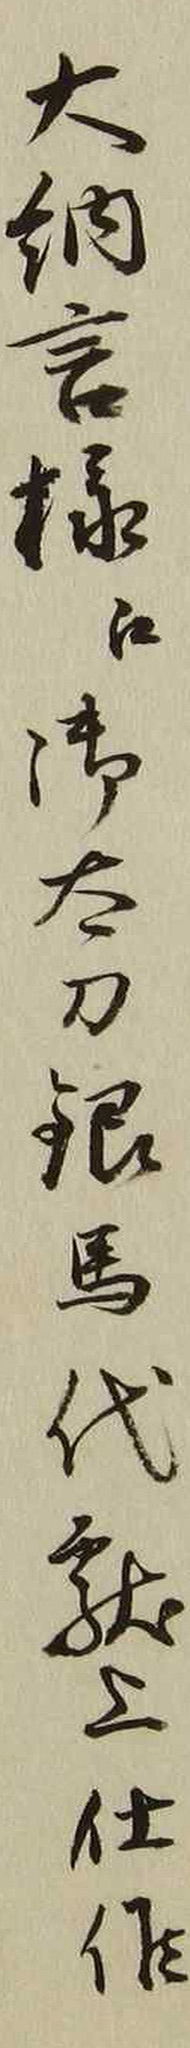大納言様江御太刀銀馬代献上仕候
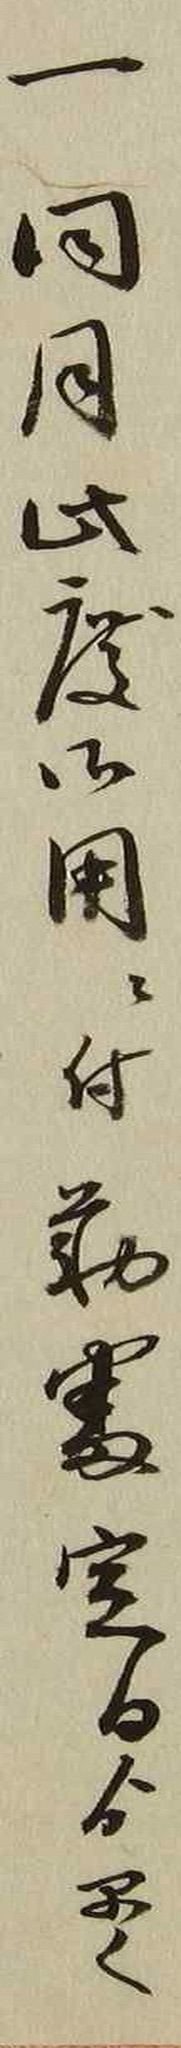一同月此度御用に付勤番定日ゟ早く
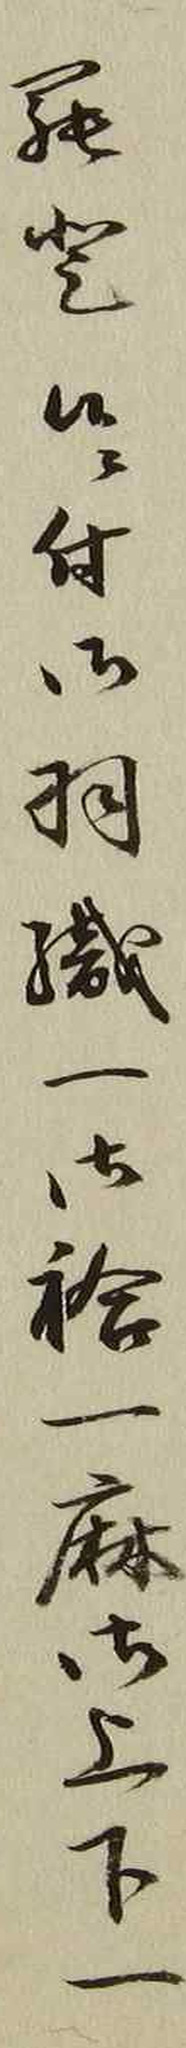罷登候に付御羽織一御袷一麻御上下一
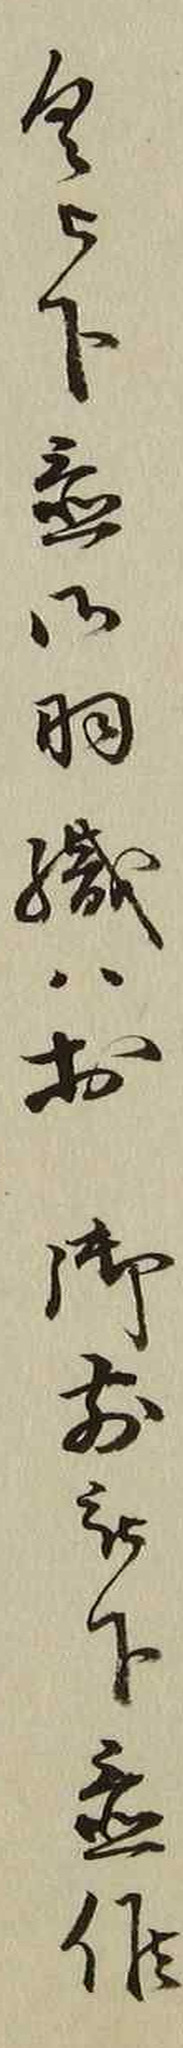具被下置御羽織は於御前被下置候
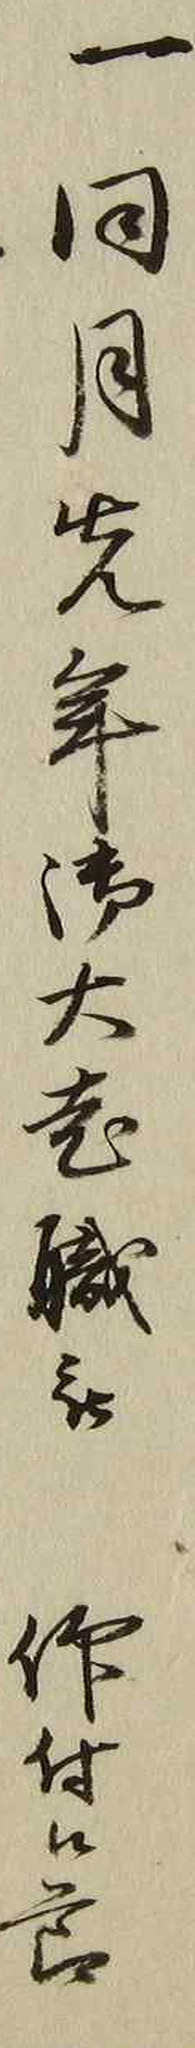一同月先年御大老職被仰付候節
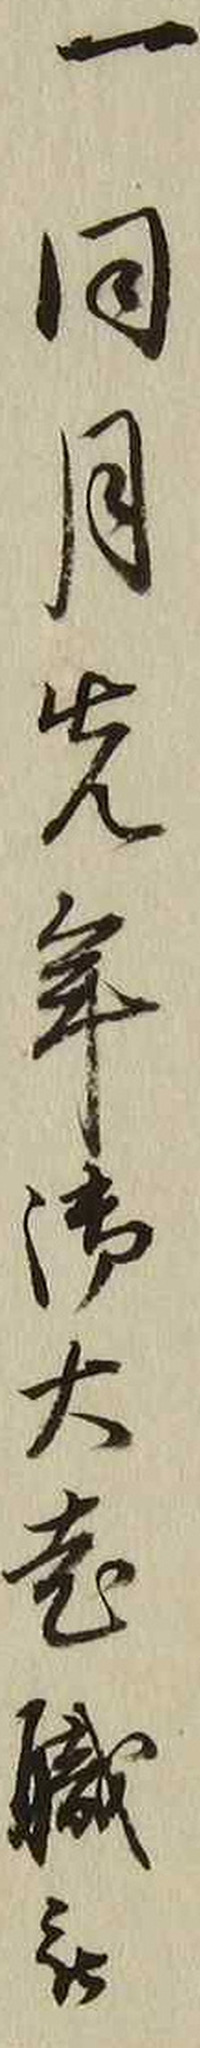一同月先年御大老職被仰付候節
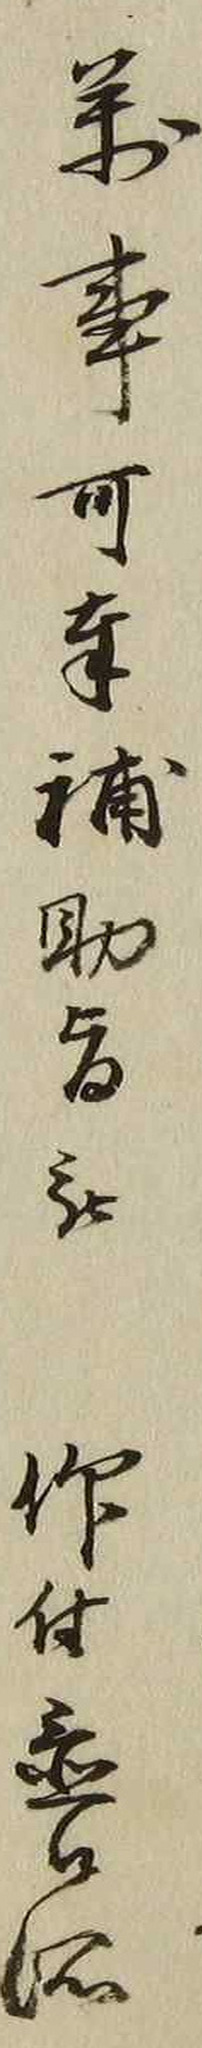萬事可奉補助旨被仰付置候所
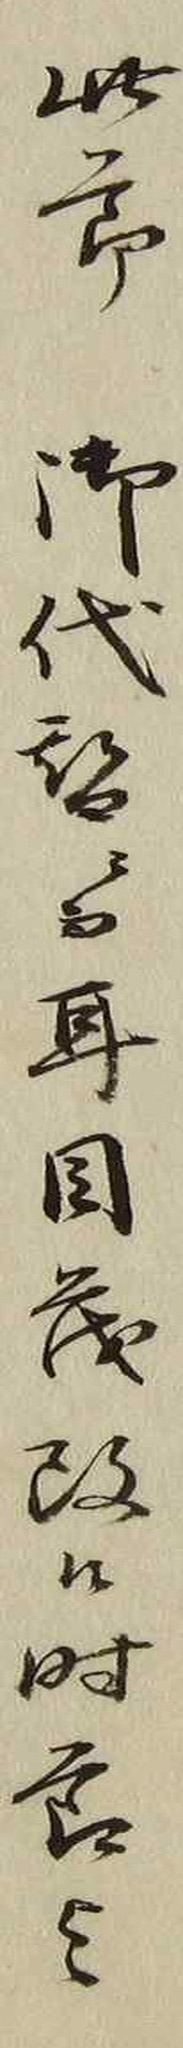此節御代替に而耳目も改候時節と
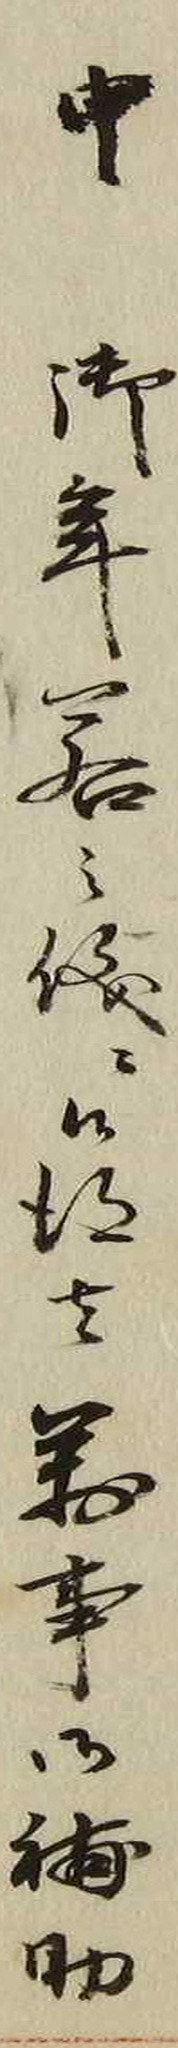申御年若之儀に候得は萬事御補助
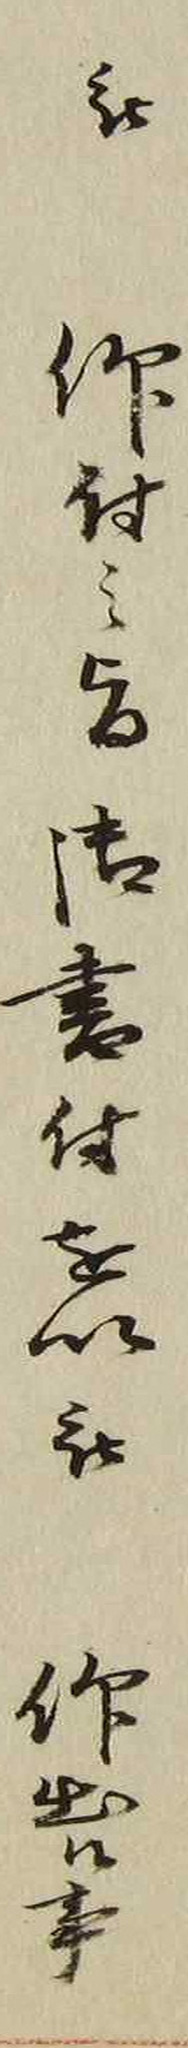被仰付之旨御書付を以被仰出候事
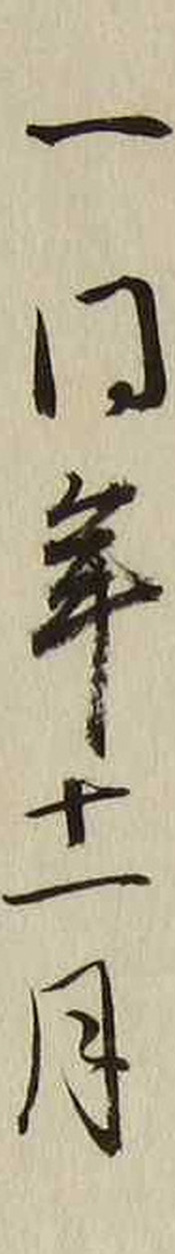一同年十一月
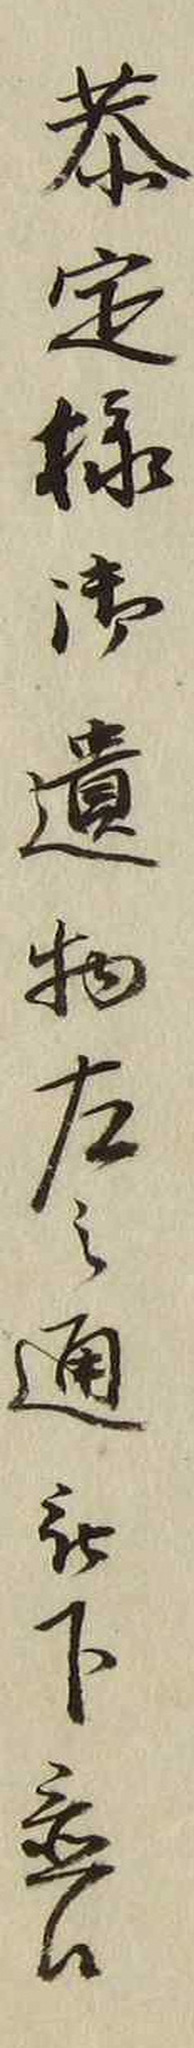恭定様御遺物左之通被下置候
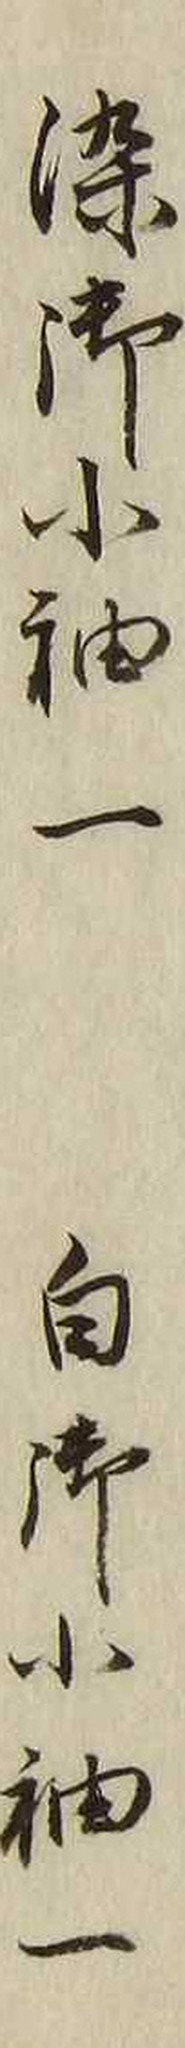染御小袖一白御小袖一
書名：諸士系譜　巻之125　た之部1
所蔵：会津若松市立会津図書館
